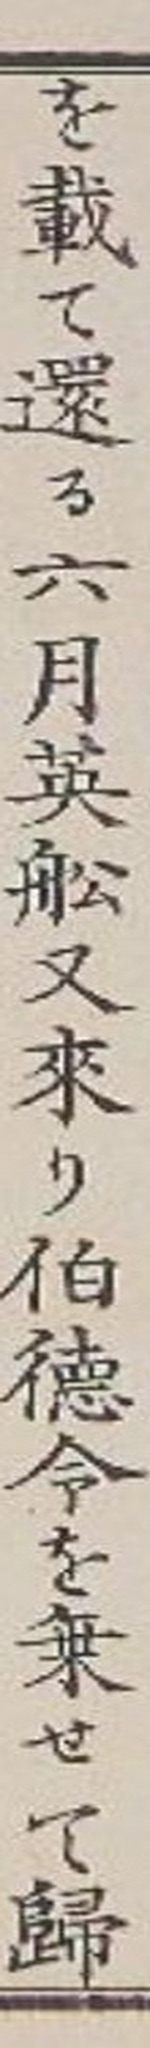を載て還る六月英船又来り其国人冒耳敦夫妻
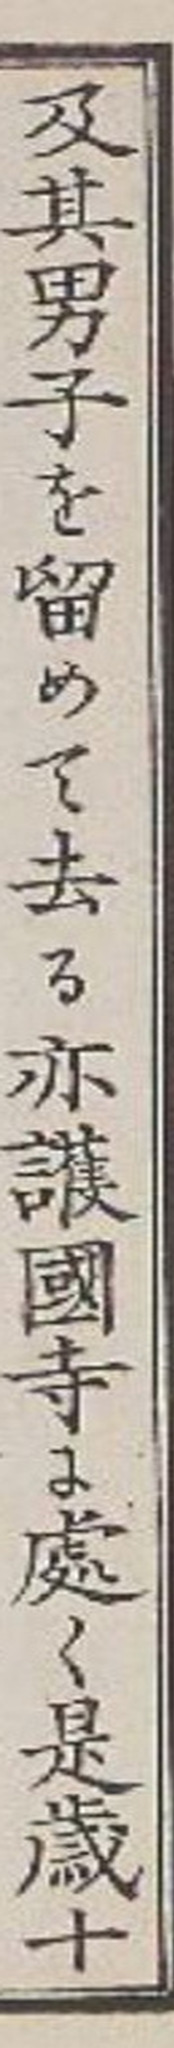及其男子を留めて去る又護国寺に処く是歳十
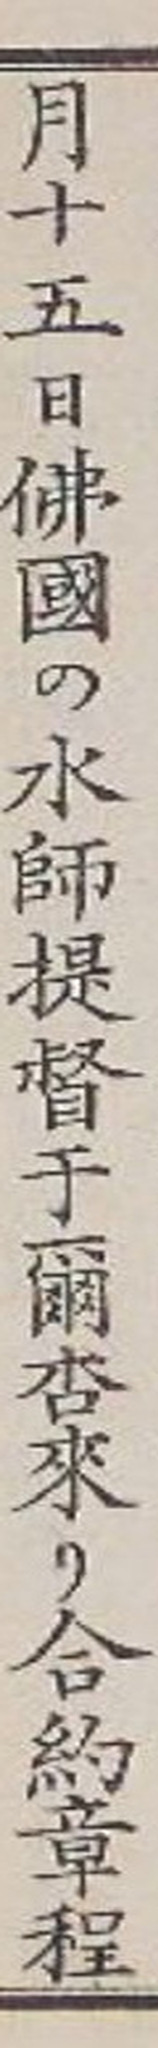月十五日仏国の水師提督于爾杏来り合約章程
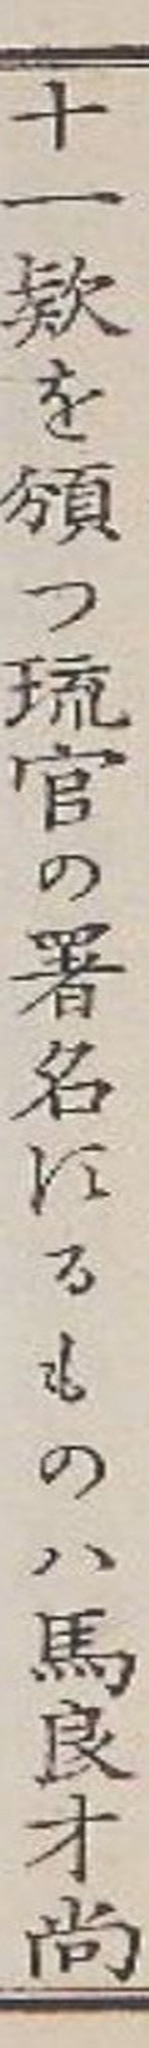十一款を頒つ琉官の署名するものは馬良才尚
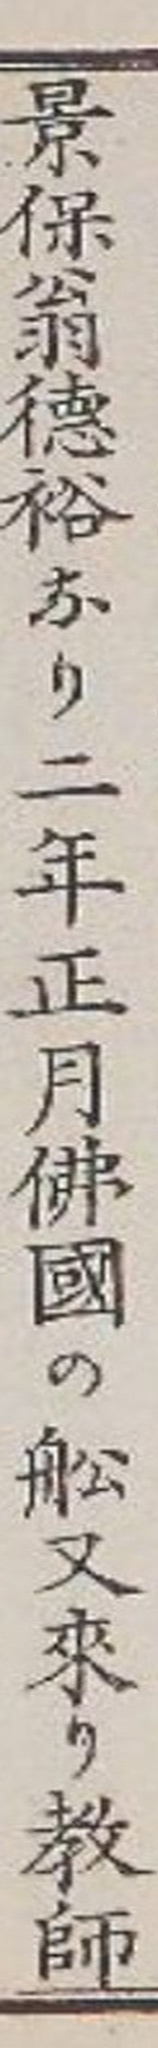景保翁徳裕なり二年正月仏国の船又来り教師
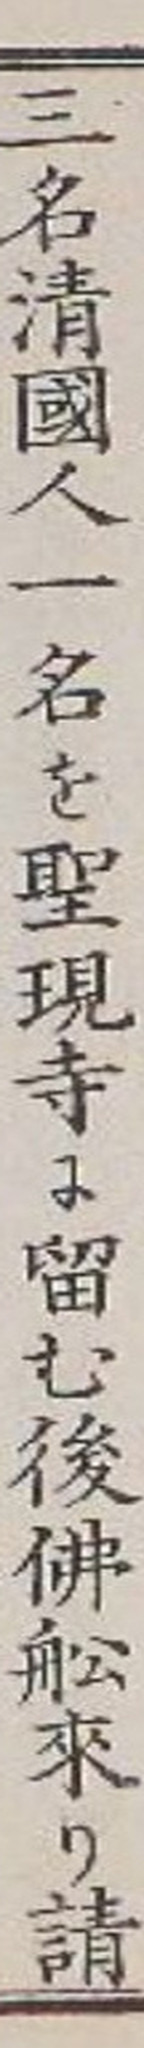三名清国人一名を聖現寺に留む後仏船来り請
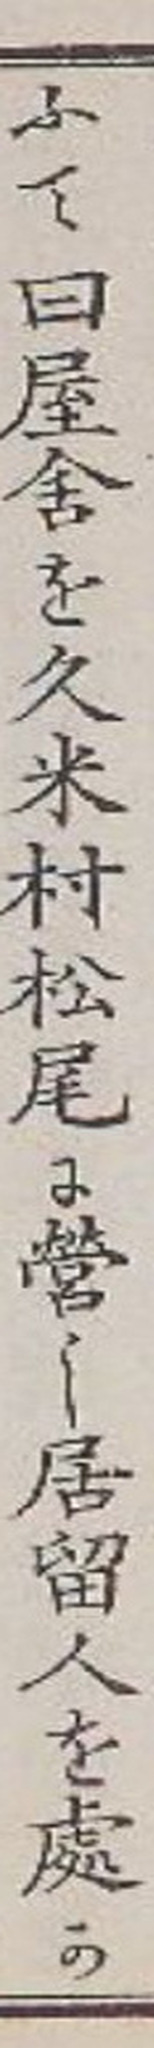ふて曰屋社を久米村松尾に営し居留人を処か
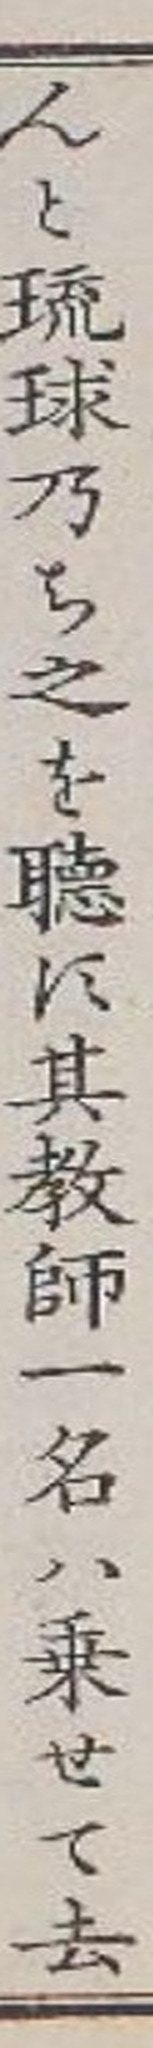んと琉球乃ち之を聴す其教師一名は乗せて去
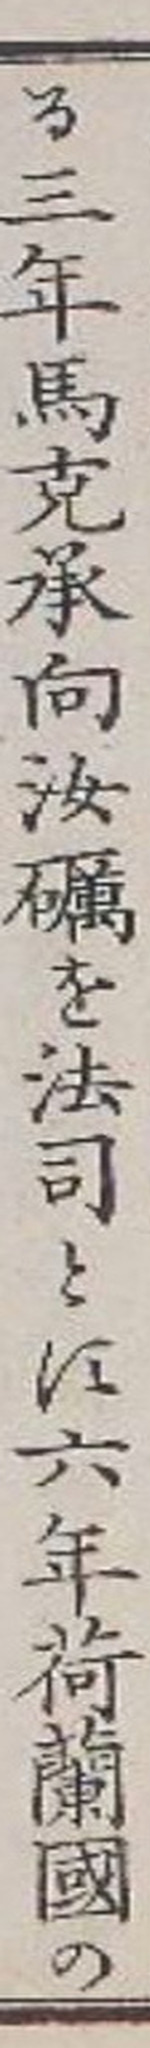る三年馬克承向汝礪を法司とす六年荷蘭国の
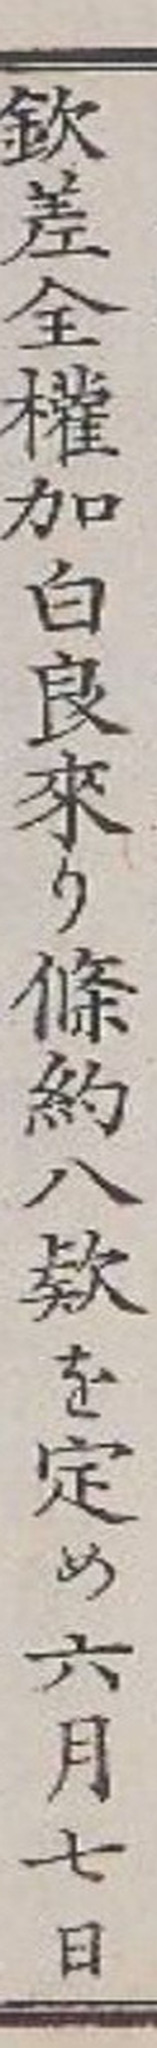欽差全権加白良来り条約八款を定め六月七日
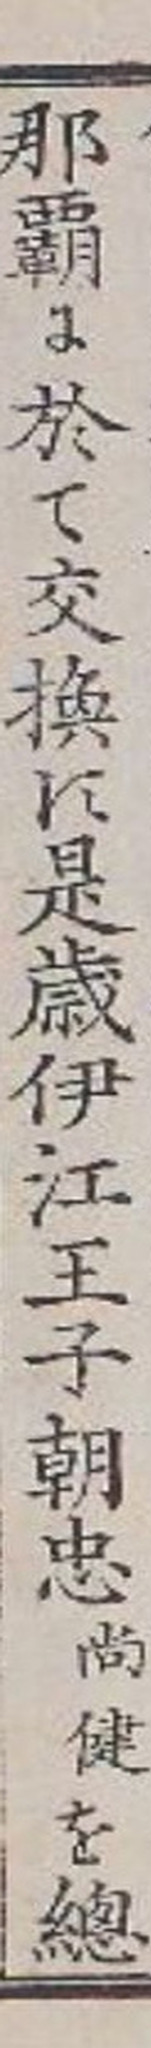那覇に於て交換す是歳伊江王子朝忠尚健を総

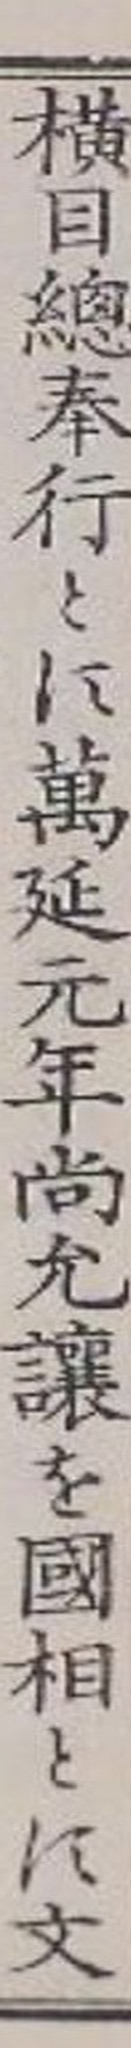横目総奉行とす万延元年尚允譲を国相とす文
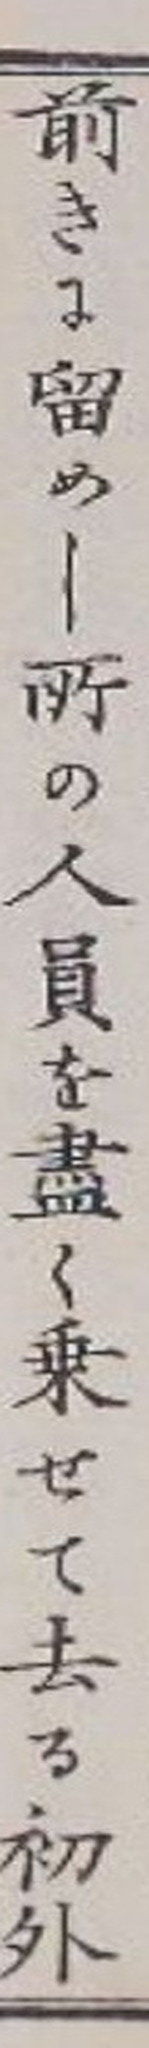前きに留めし所の人員を尽く乗せて去る初外
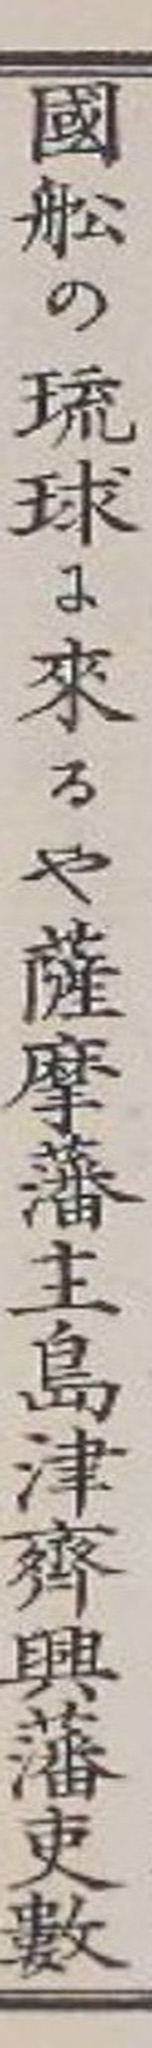国船の琉球に来るや薩摩藩主島津斉興藩吏数
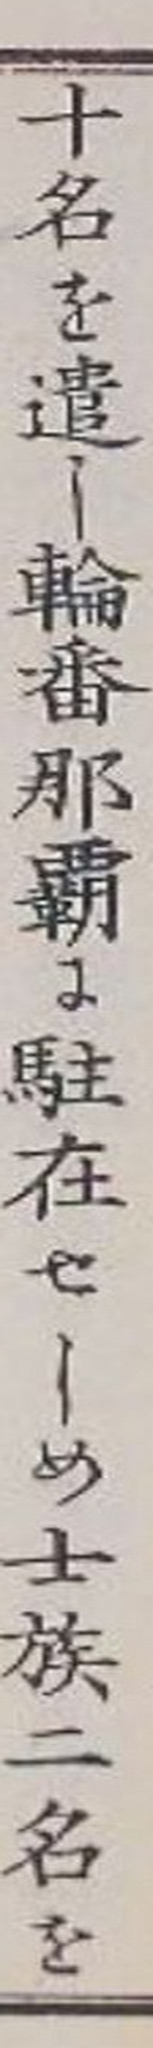十名を遣し輪番那覇に駐在せしめ士族二名を
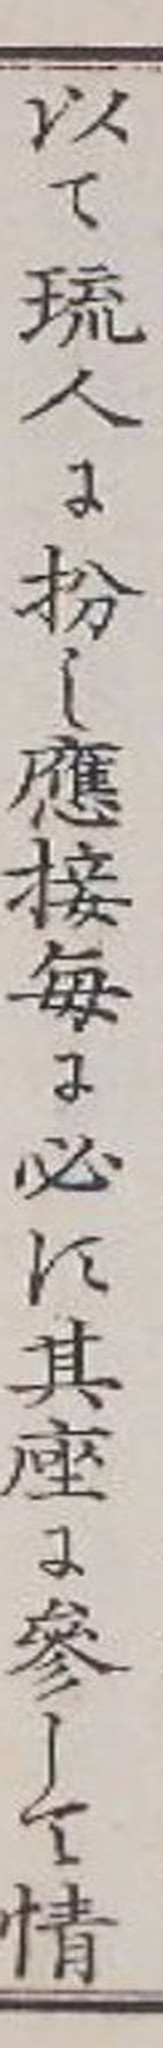以て琉人に扮し応接毎に必す其座に参して情
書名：南島紀事 下
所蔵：University of the Ryukyus Library
